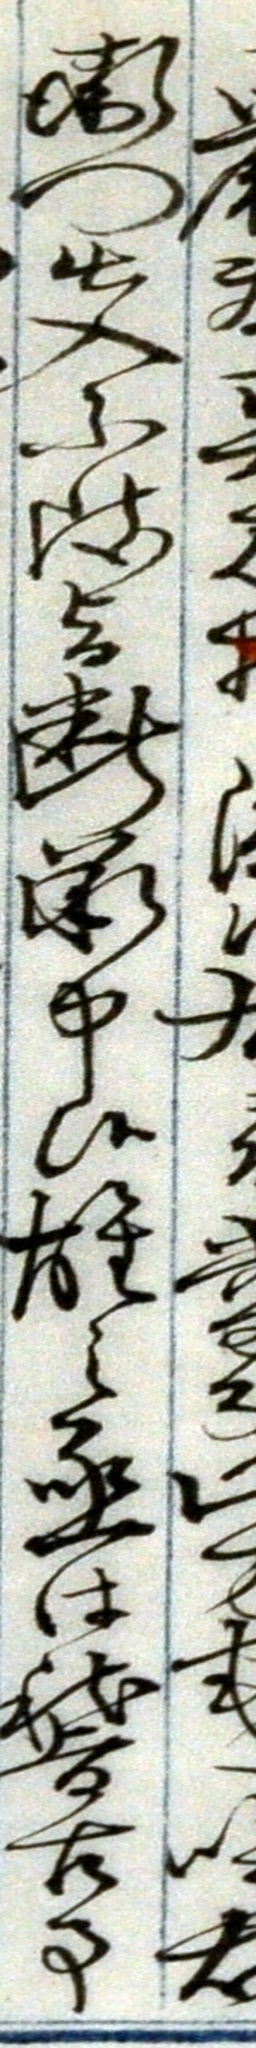衛門出入不致旨断承申候雄之丞は稽古事
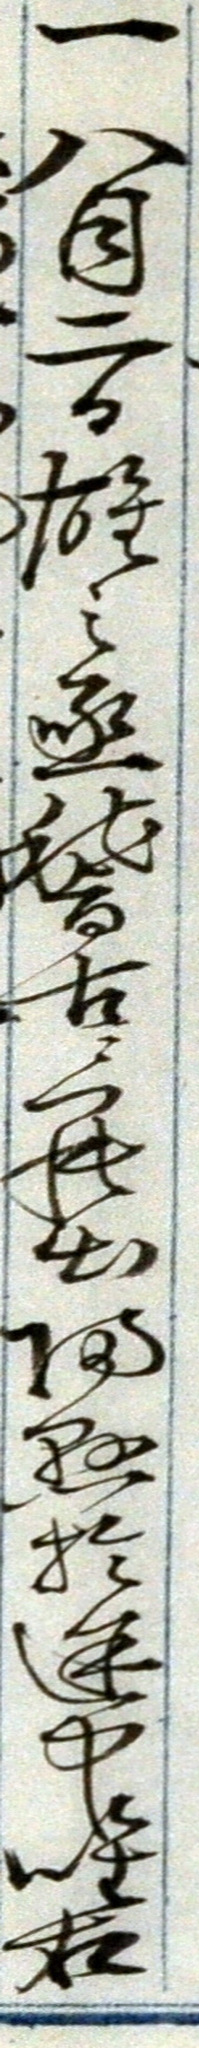一八月二日雄之丞稽古ニ罷出帰懸於途中唯右
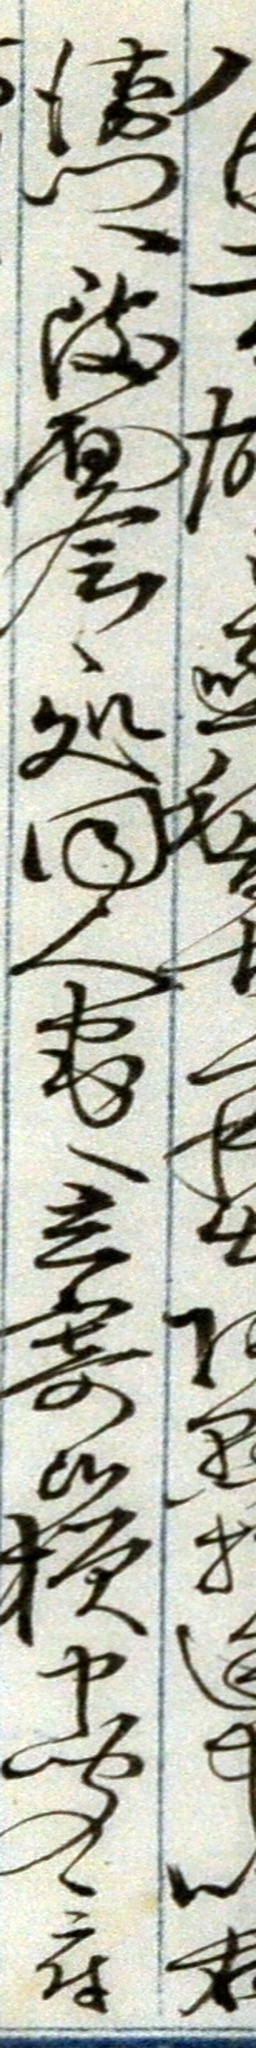衛門へ致面会候処同人宅へ立寄候様申聞候二付
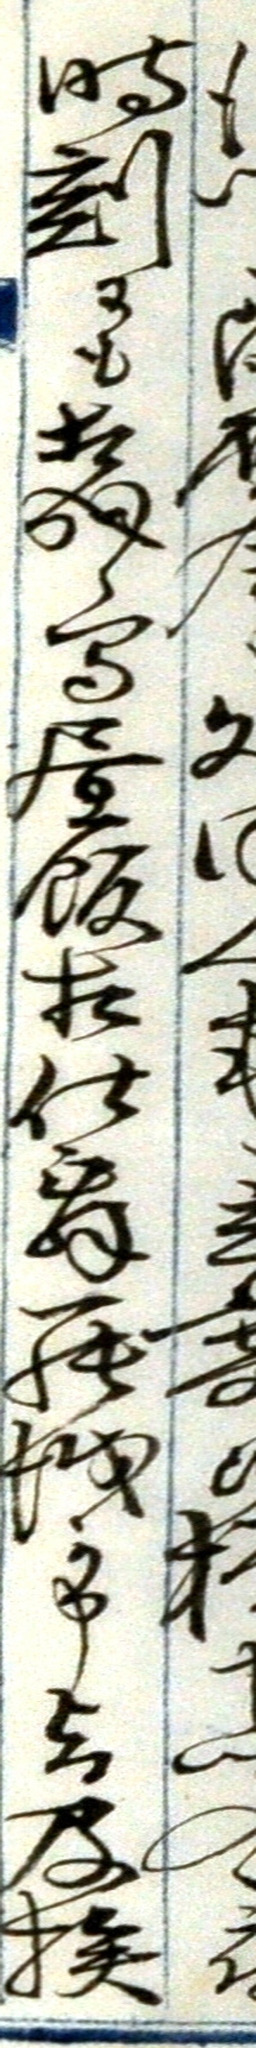時刻尓も相成候間昼飯相仕舞罷越可申旨及挨

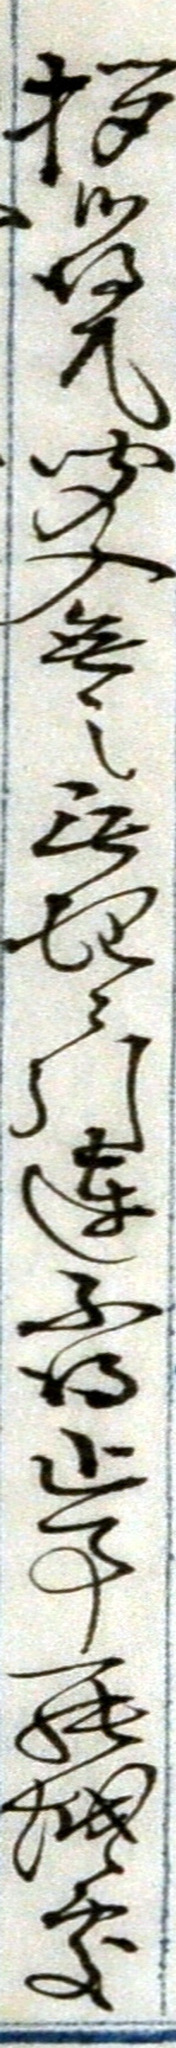拶候得共聞入無之無理ニ引連不得止事罷越候處
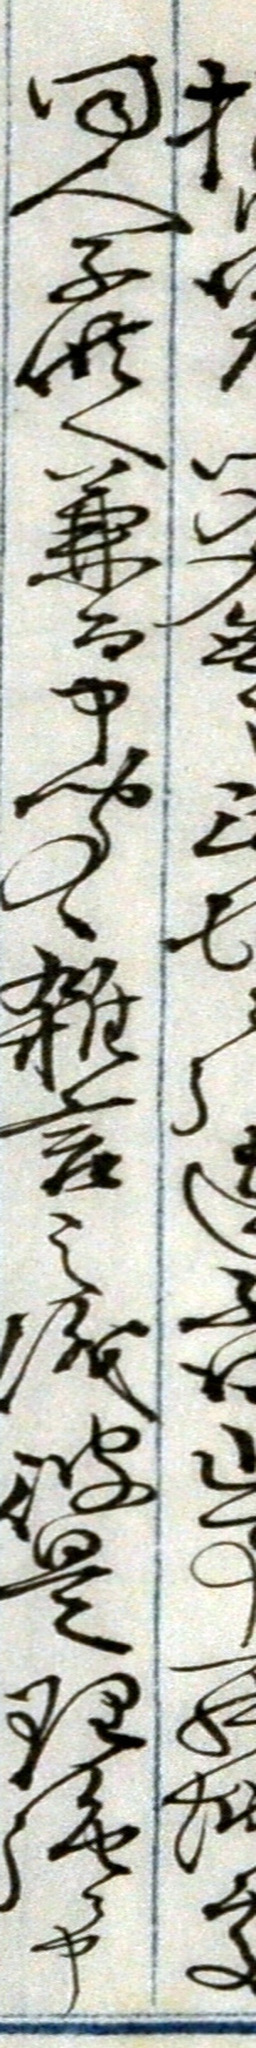同人子供へ兼而申聞候雑言之儀彼是理強ニ申
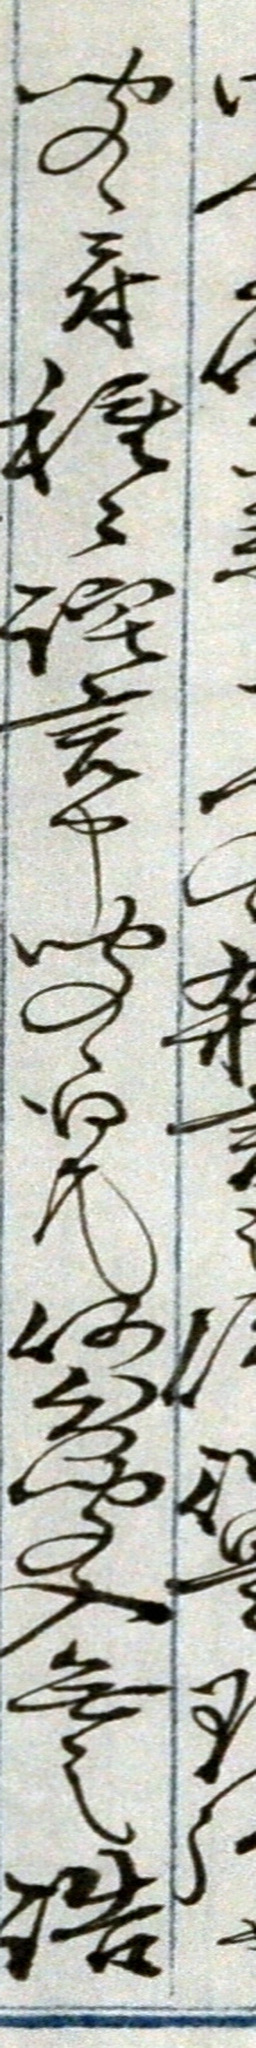聞候二付種々詫言申聞候得共何分聞入無之詰
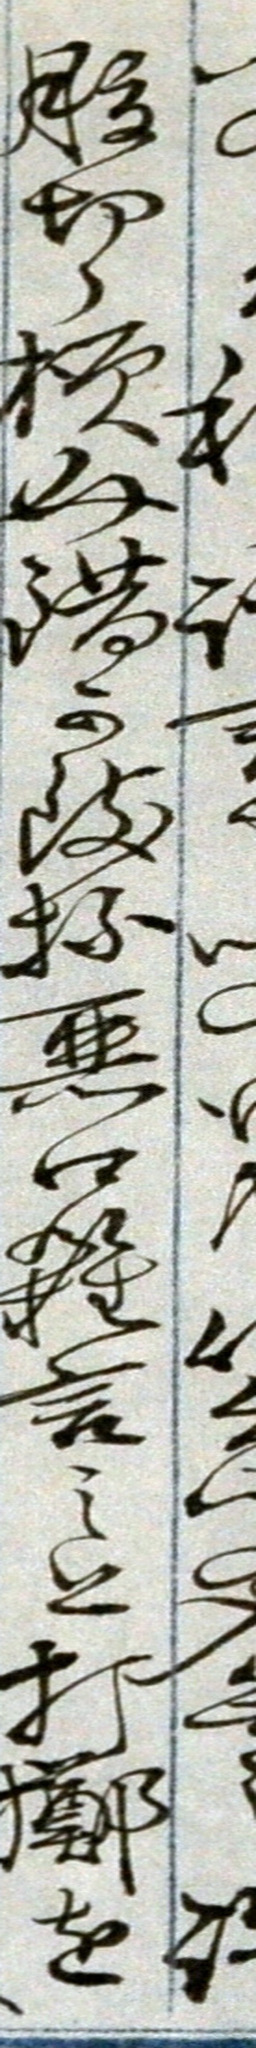腹切候様介錯可致抔悪口雑言之上打擲を
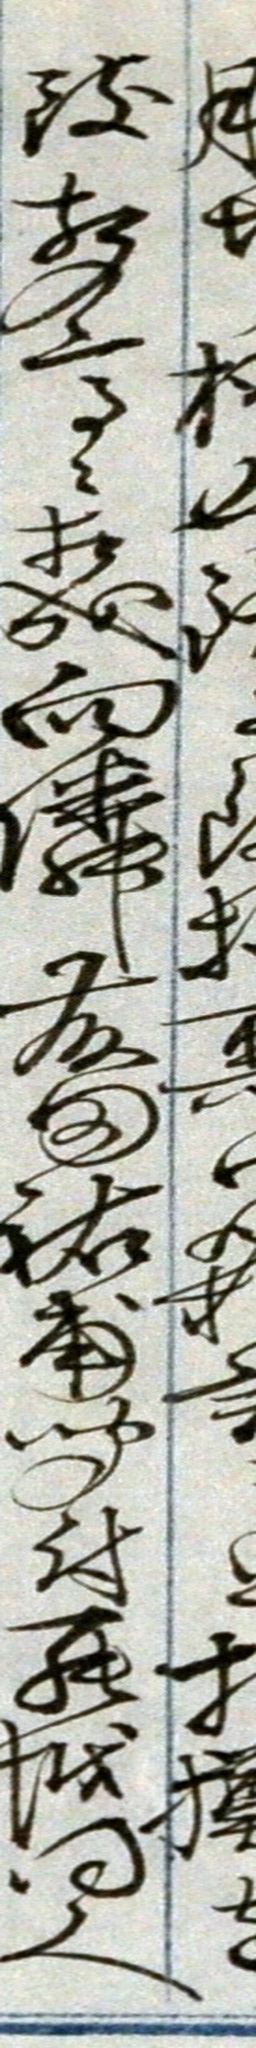致聲高ニ相成向隣藤田祐甫聞付罷越同人
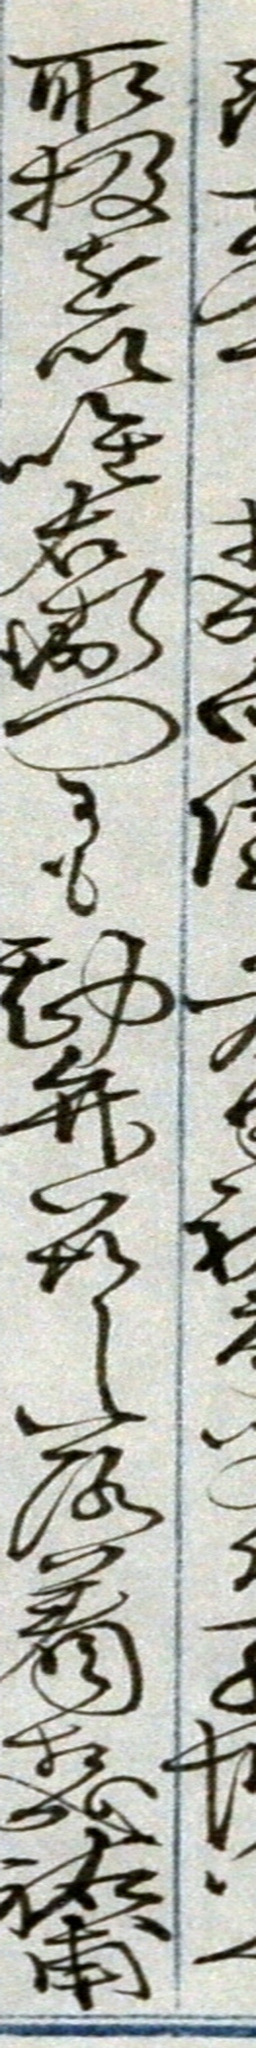取扱を以唯右衛門尓も勘弁いたし落着相成祐甫
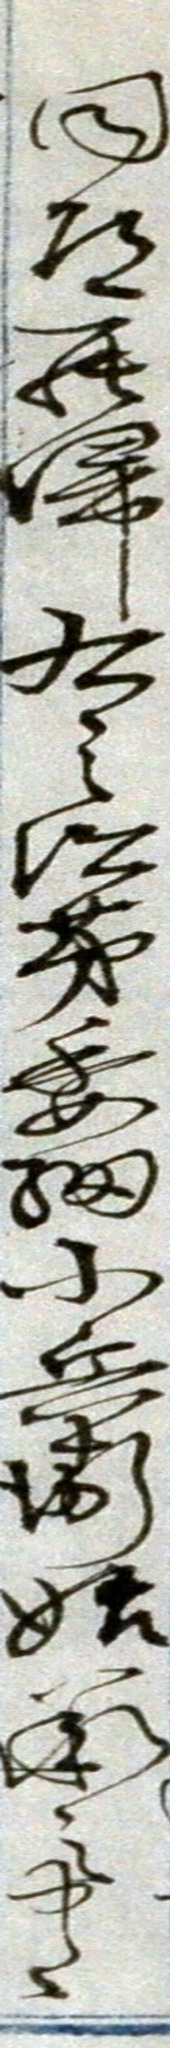同道罷帰右之次第委細小兵衛始承之申候
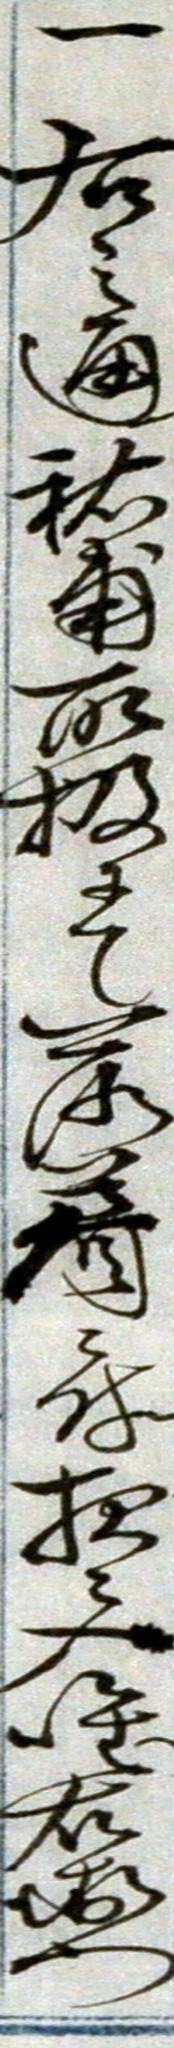一右之通祐甫取扱尓て落着ニ付夜ニ入唯右衛門
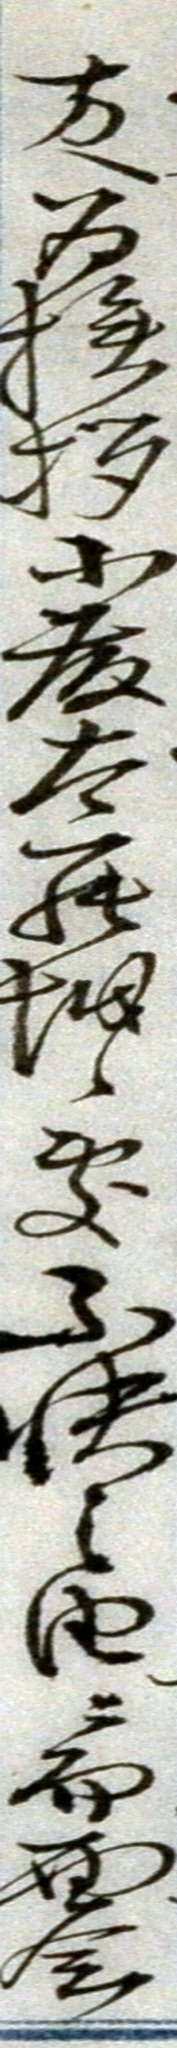方へ為挨拶小藤太罷越候處不快之由ニ而面会
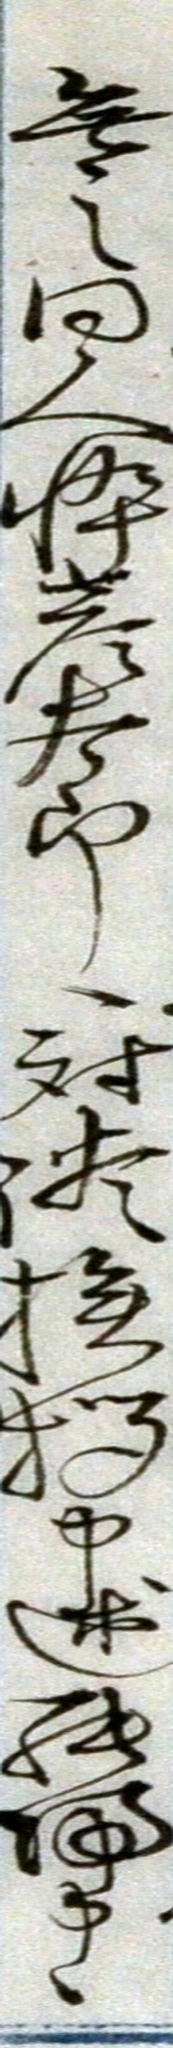無之同人忰彦太郎へ対談挨拶申述罷帰申候
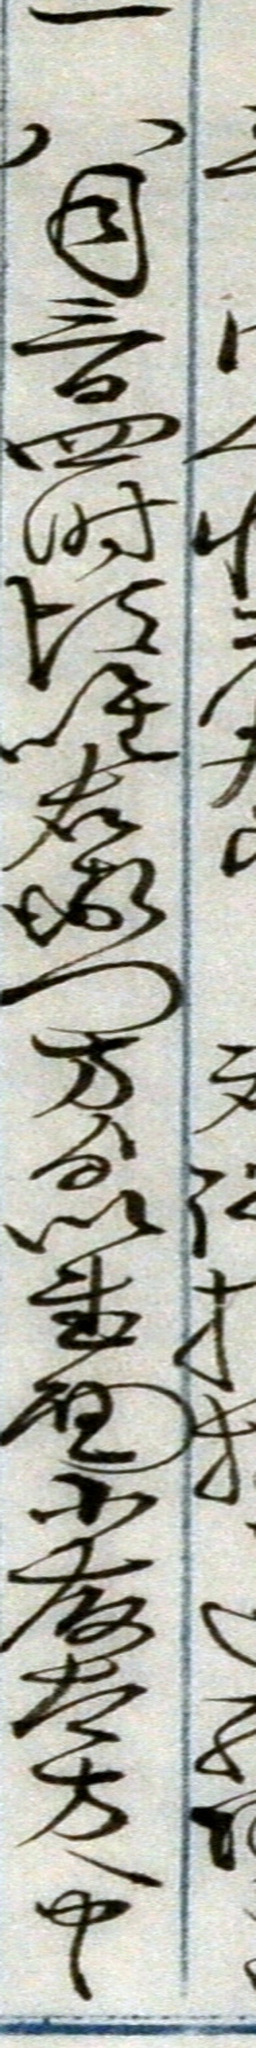一八月三日四時頃唯右衛門方ゟ以書面小藤太方へ申
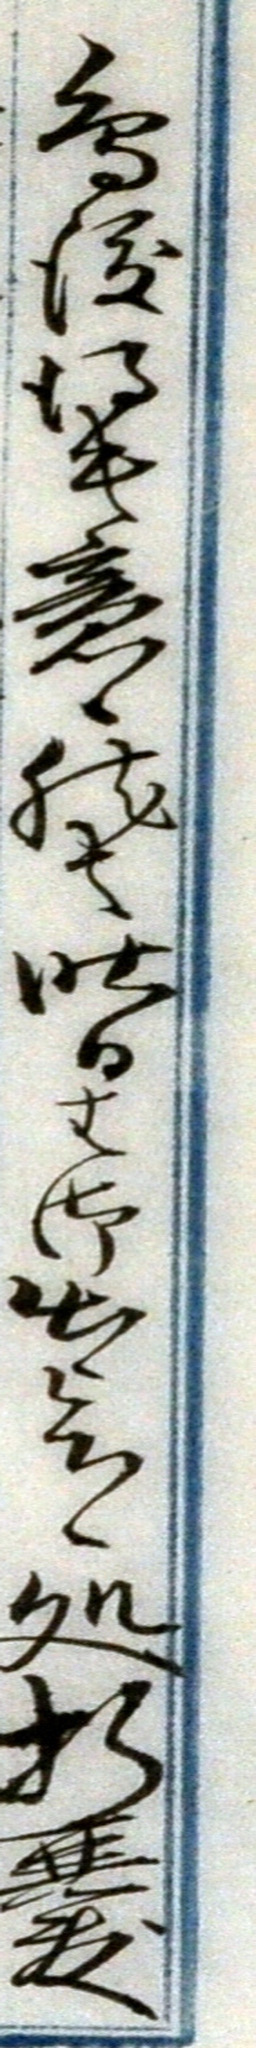鳥渡得貴意候然者昨日者御出被下候処折悪敷
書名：川面小藤太子細有之多賀谷唯右衛門ヲ打果候一件
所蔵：伊那市立高遠町図書館・合同会社AMANE
